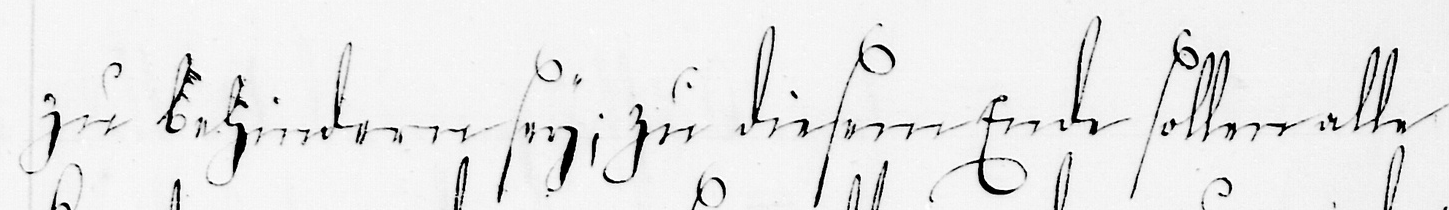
zu behindern sey; zu diesem Ende sollen alle
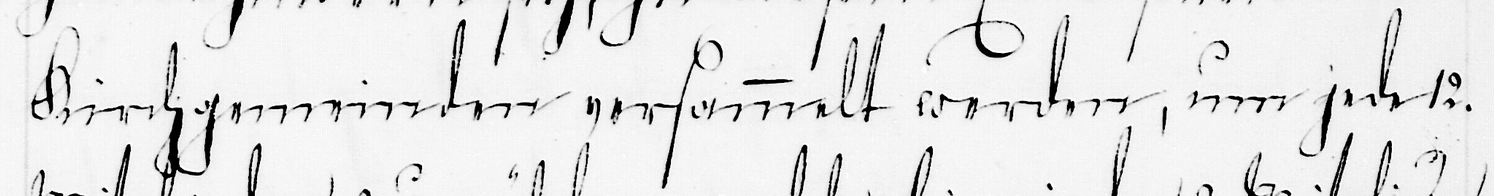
Kirchgemeinden versammelt werden, um jede 12.
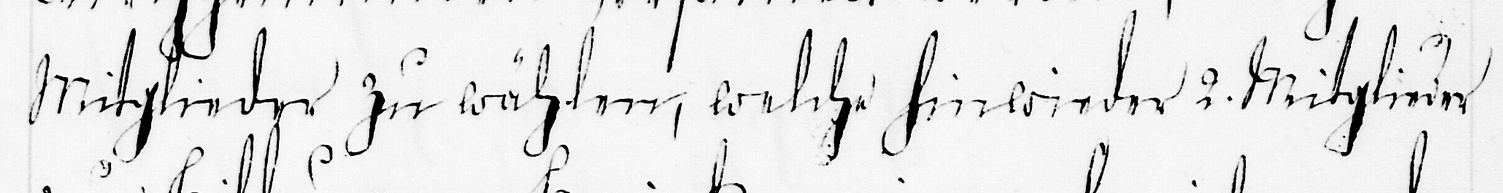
Mitglieder zu wählen, welche hinwieder 2. Mitglieder
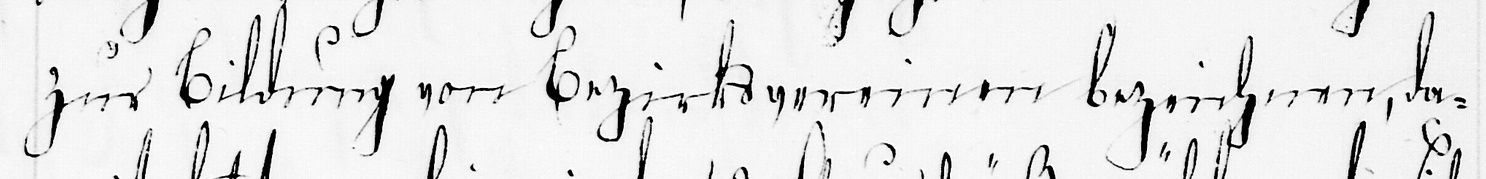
zur Bildung von Bezirksvereinen bezeichnen, da¬
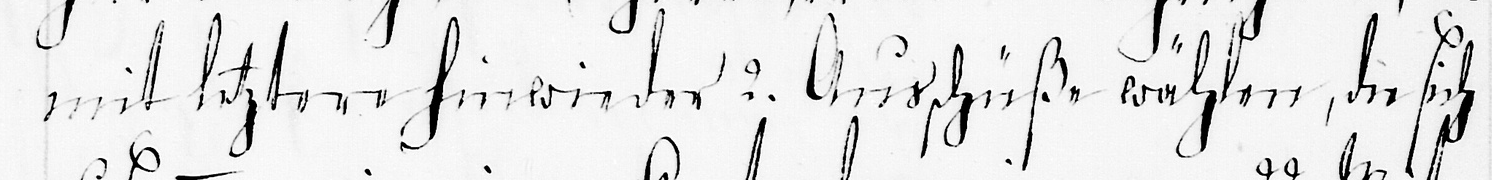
mit letztere hinwieder 2. Ausschüße wählen, die si¬
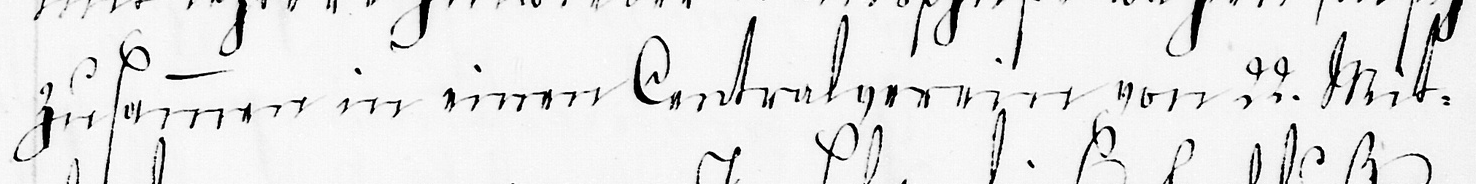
zusammen in einen Centralverein von 22. Mit¬
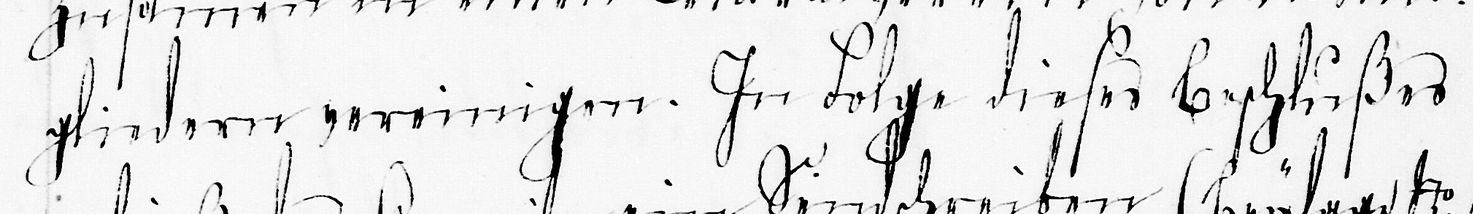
gliedern vereinigen. In Folge dieses Beschlußes
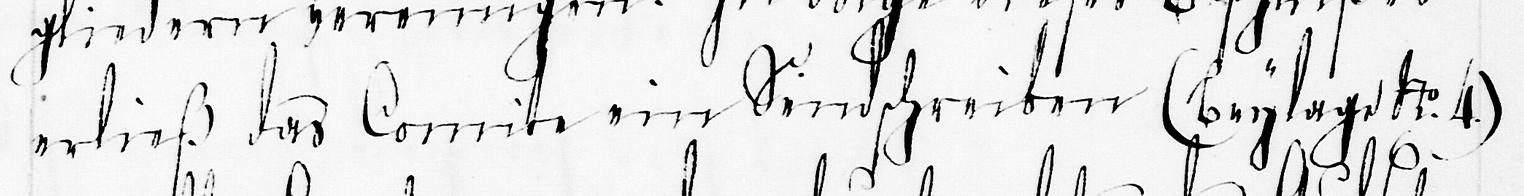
erließ das Comite ein Sendschreiben (Beylage No. 4.)
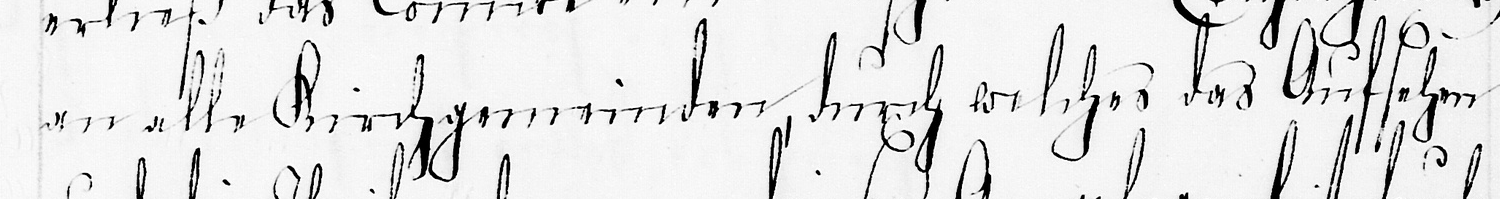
an alle Kirchgemeinden, durch welches das Aufsehen
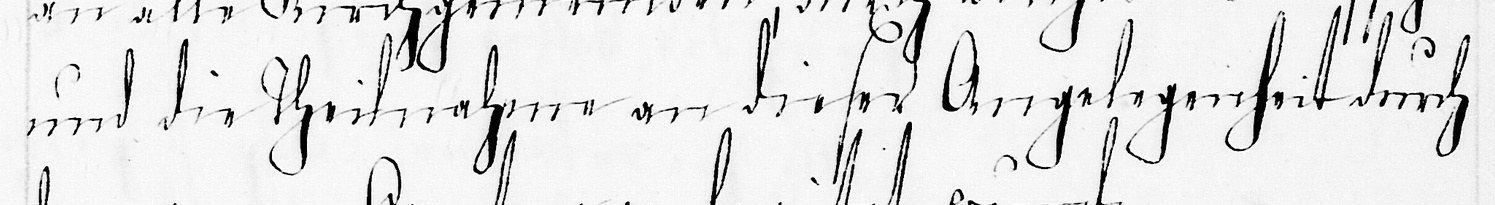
und die Theilnahme an dieser Angelegenheit durch
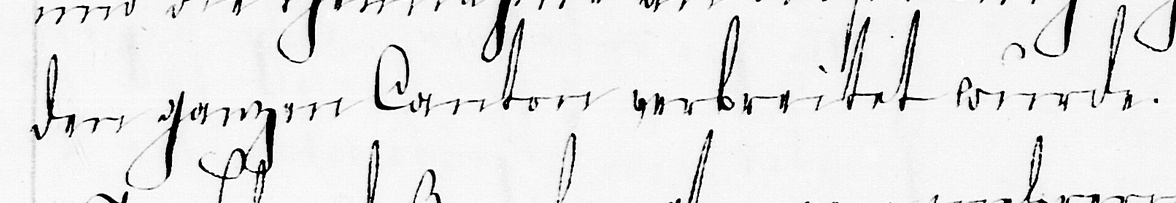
den ganzen Canton verbreitet wurde.
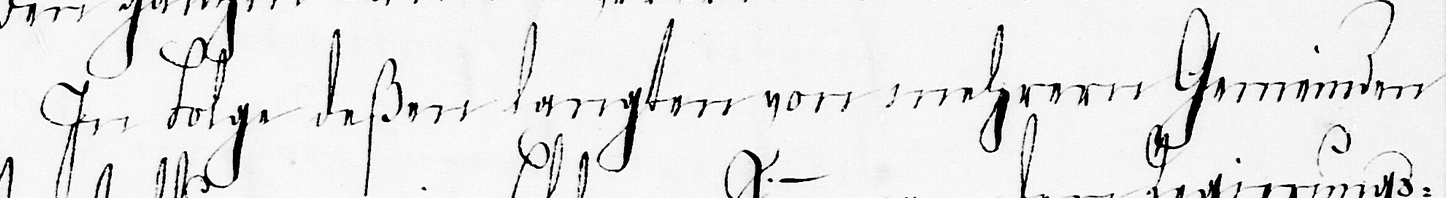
In Folge deßen langten von mehrern Gemeinden
